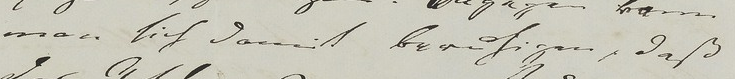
man sich damit beruhigen, daß
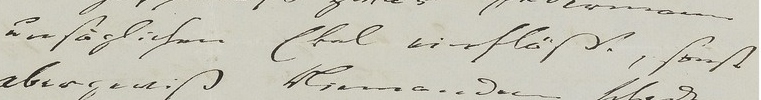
unsäglichen Ekel einflößt, sonst
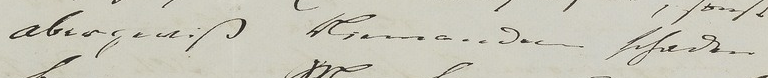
aber gewiß Niemandem schaden
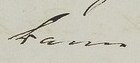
kann.
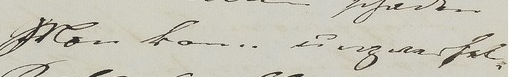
Man kann unzweifel-
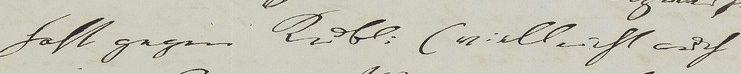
haft gegen Kubli (vielleicht auch
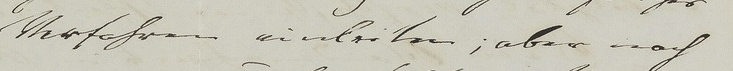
Verfahren einleiten; aber nach
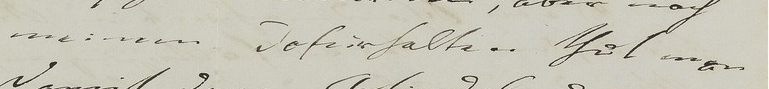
meinem Dafürhalten thut man
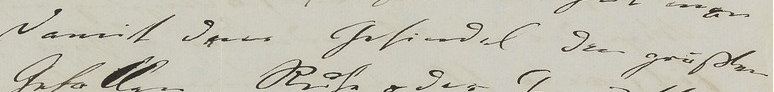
damit dem Gesindel den größten
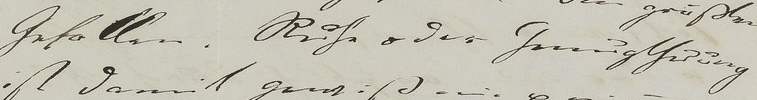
Gefallen. Ruhe oder Genugthuung
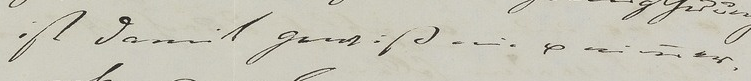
ist damit gewiß nie & nimmer-
